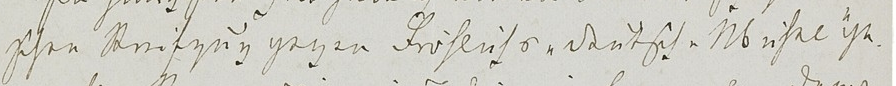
schen Streifzug gegen Fröhlichs «Deutsch-Michel» ge-
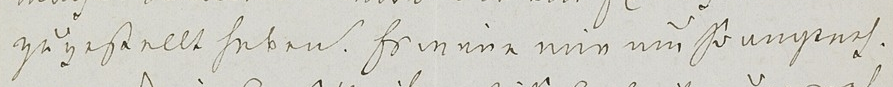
zugestellt haben. Es wäre mir um so angeneh-
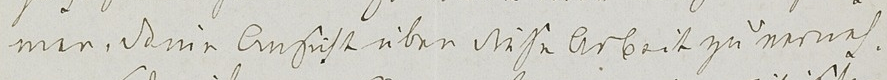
mer, deine Ansicht über diese Arbeit zu verneh-
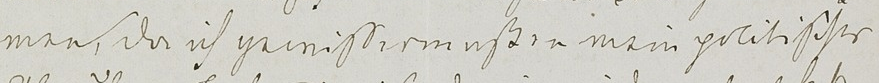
men, da ich gewissermaßen mein politisches
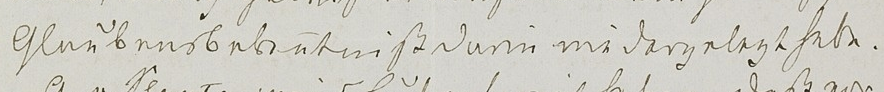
Glaubensbekenntniß darin niedergelegt habe.
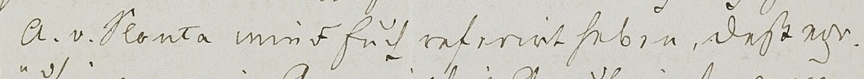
A. v. Planta wird Euch referirt haben, daß vor-
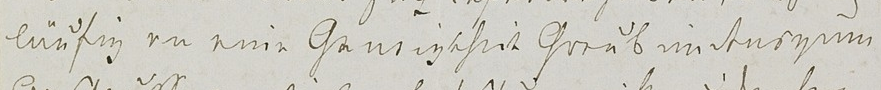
läufig an eine Geneigtheit Graubündens zum
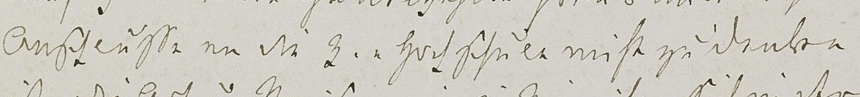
Anschlusse an die Z.-Hochschule nicht zu denken
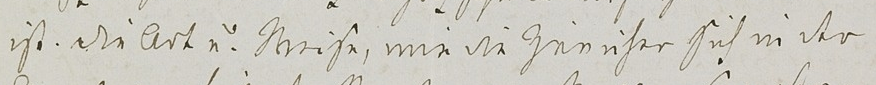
ist. Die Art u. Weise, wie die Züricher sich in der
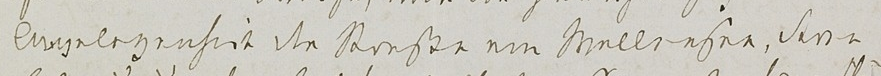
Angelegenheit der Straße am Wallensee, deren
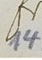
Chur
